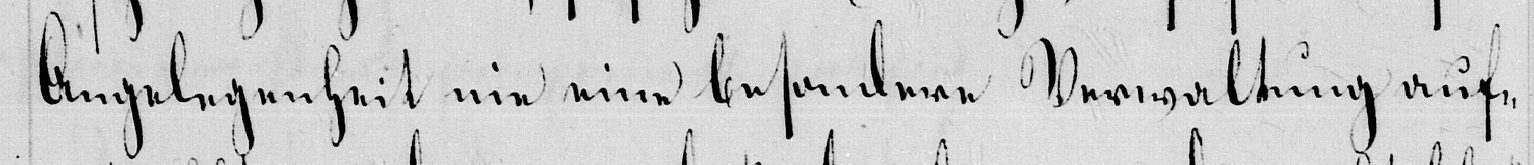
Angelegenheit nie eine besondere Verwaltung auf¬
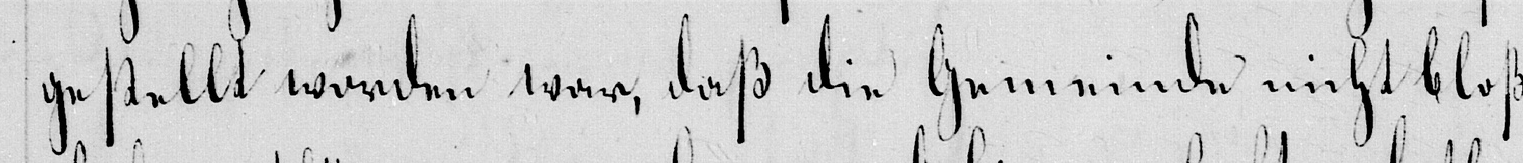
gestellt worden war, daß die Gemeinde nicht bloß
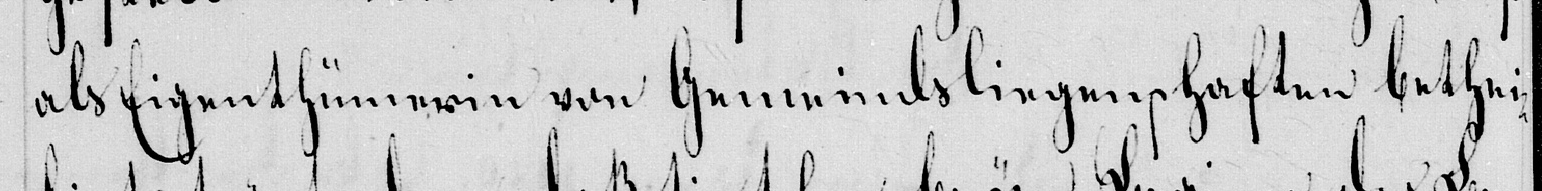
als Eigenthümerin von Gemeindsliegenschaften bethei¬
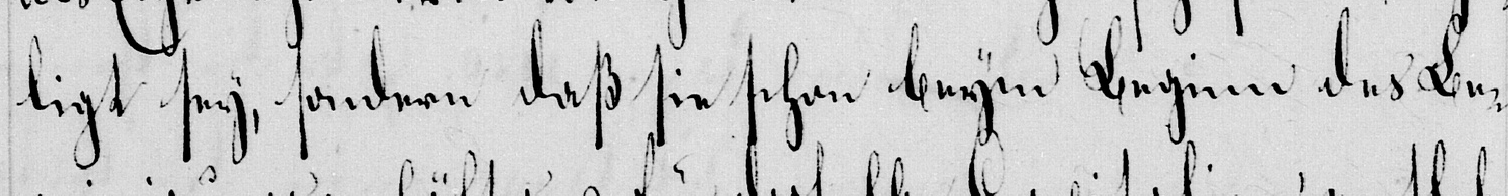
ligt sey, sondern daß sie schon beym Beginn des Be¬
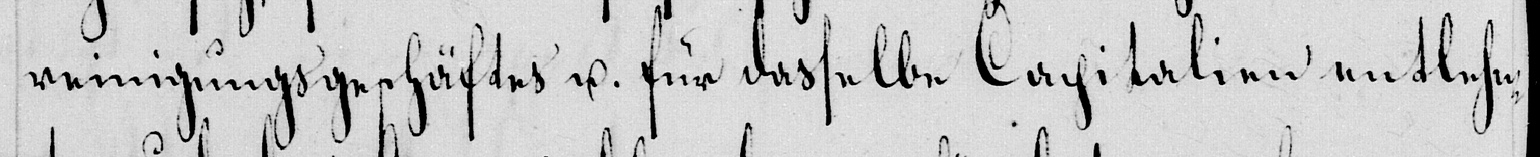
reinigungsgeschäftes u. für dasselbe Capitalien entbehr¬
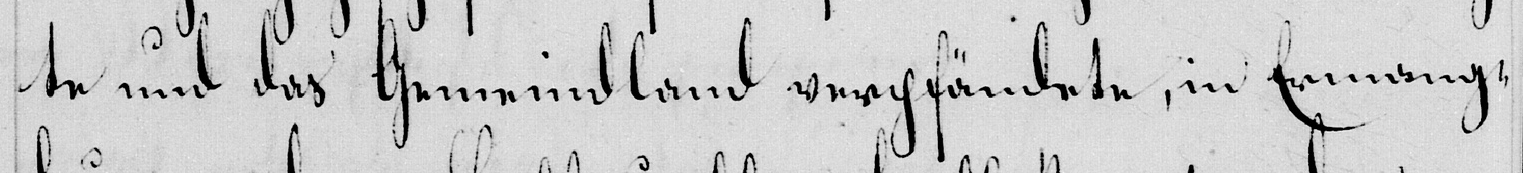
te und das Gemeindland verpfändete, in Ermang¬
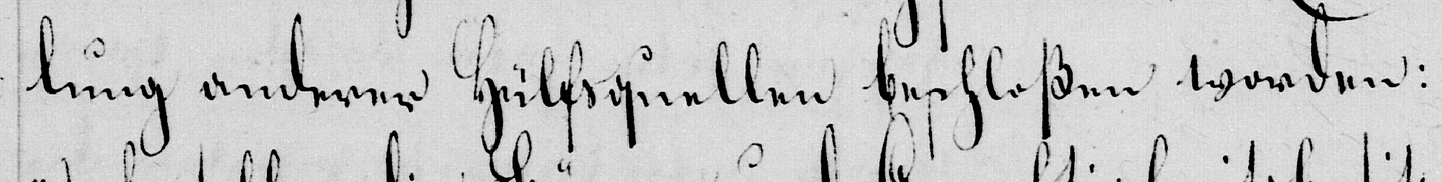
lung anderer Hülfsquellen beschloßen worden:
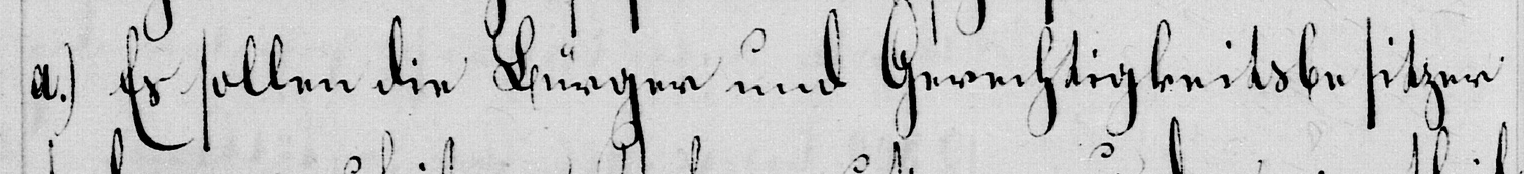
a.) Es sollen die Bürger und Gerechtigkeitsbesitzer
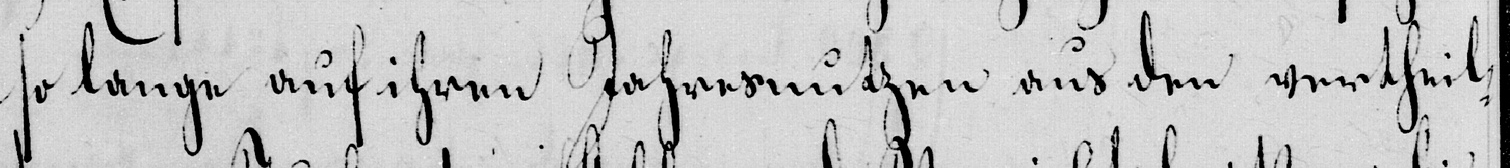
so lange auf ihren Jahresnutzen aus den vertheil¬
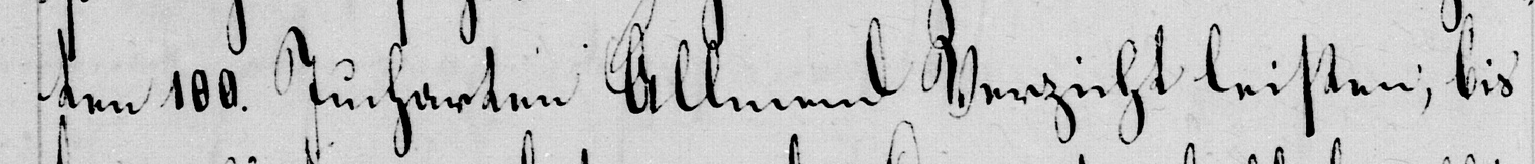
ten 100. Jucharten Allmend Verzicht leisten, bis
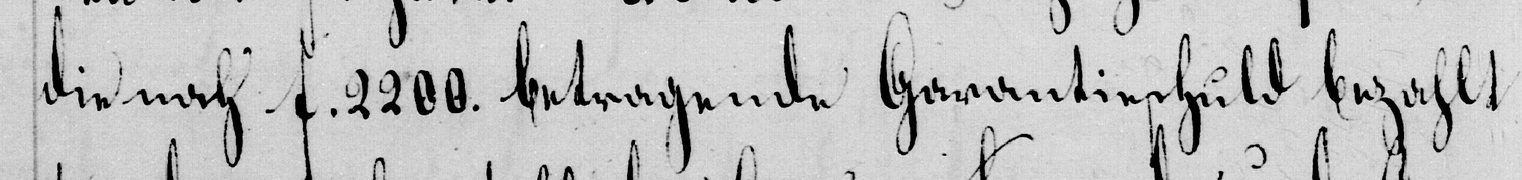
die noch f. 2200. betragende Garantieschuld bezahlt
